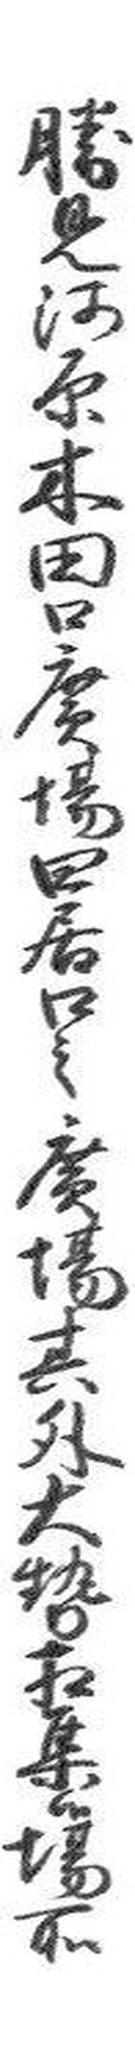勝見河原木田口広場四居口之広場其外大勢相集候場所
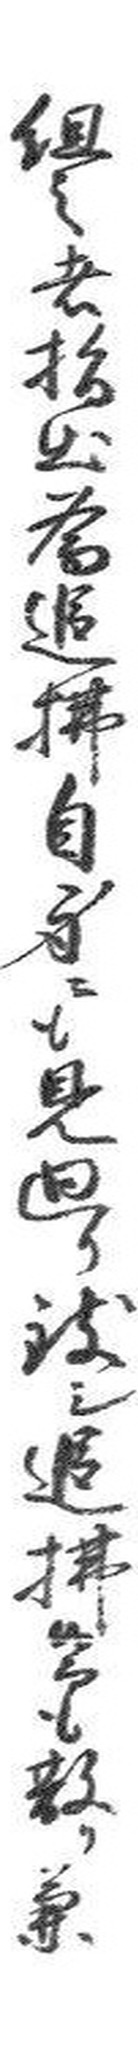組之者指出為追払自身ニも見廻り致シ追払候而も散り兼
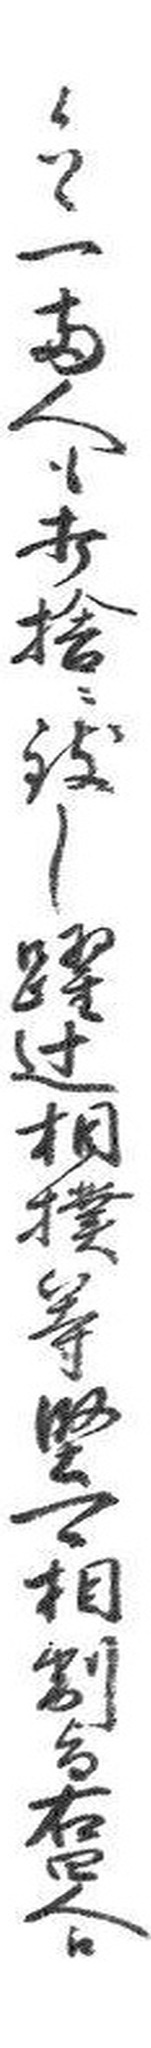候はゝ一両人も打捨ニ致し躍辻相撲等堅可相制旨右四人江
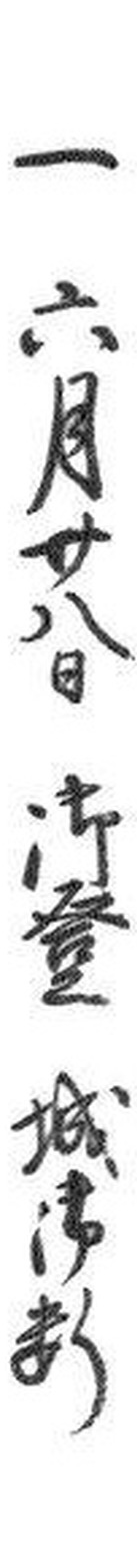一六月廿八日御登城御断
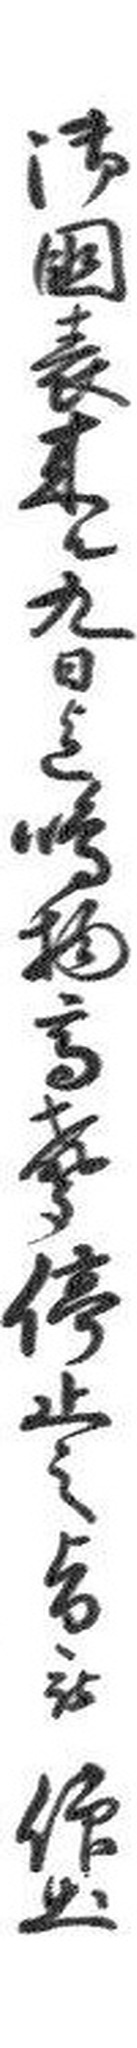御国表来ル九日迄鳴物高声停止之旨被仰出
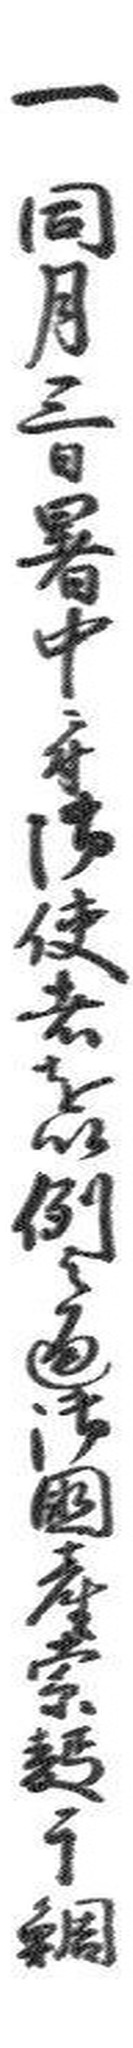一同月三日暑中ニ付御使者を以例之通御国産索麺干鯛
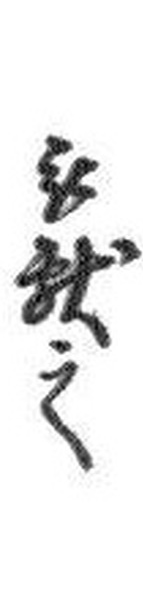被献之
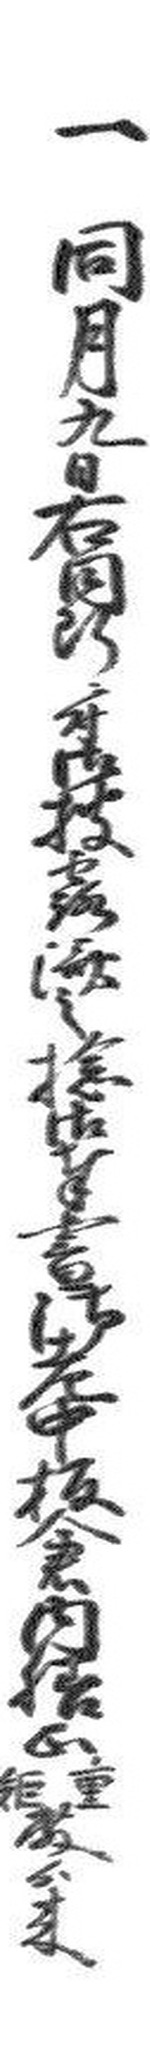一同月九日右同断ニ付御披露済之捻御奉書御老中板倉内膳正重矩殿ゟ来
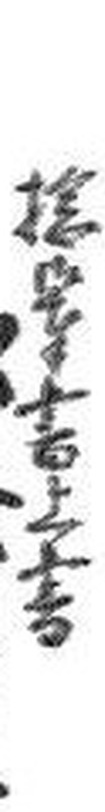捻御奉書上書
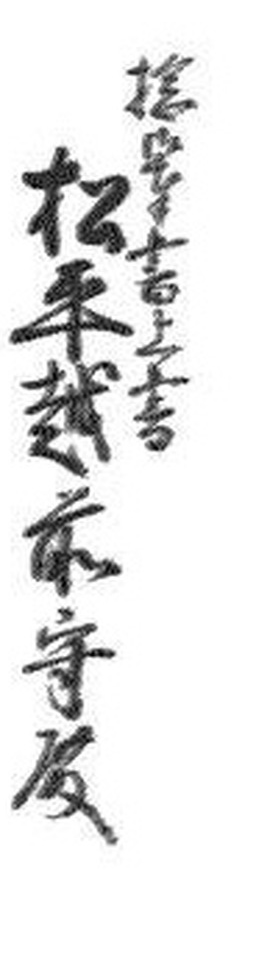松平越前守殿重矩
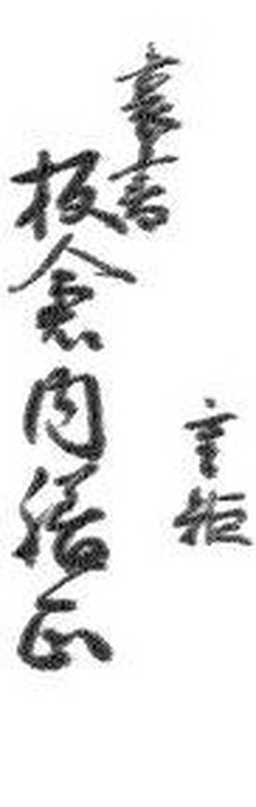板倉内膳正
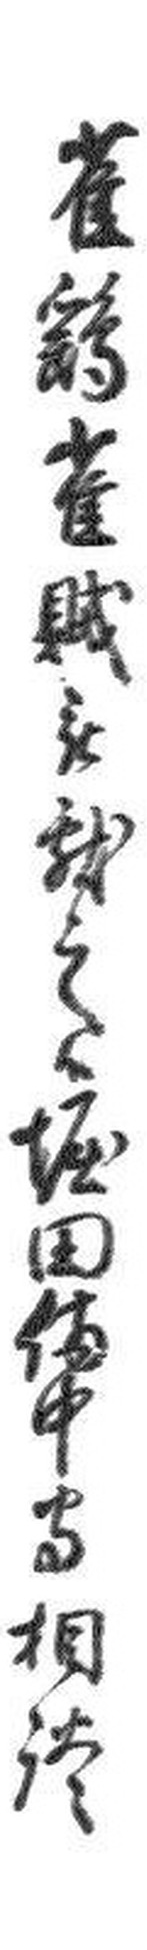雀鶏雀鵝被献之候堀田備中守相談
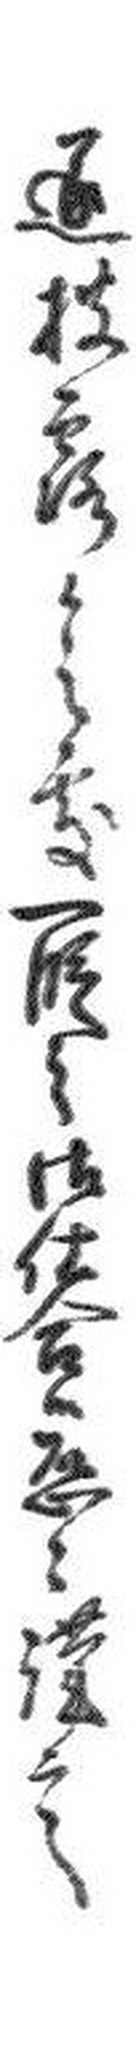遂披露候之処一段之御仕合候恐々謹言

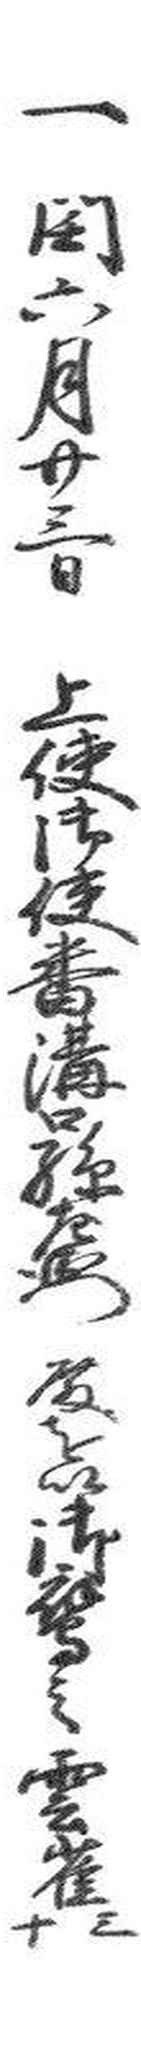一閏六月廿三日上使御使番溝口孫左衛門殿を以御鷹之雲雀三十
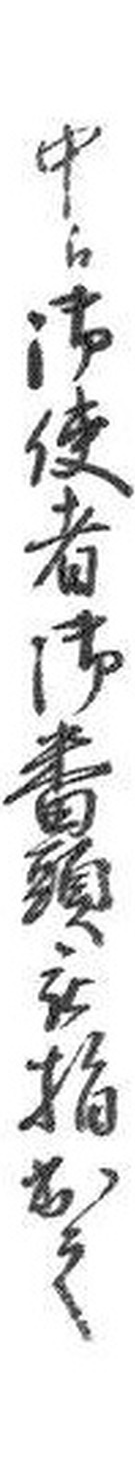中江御使者御番頭被指出之
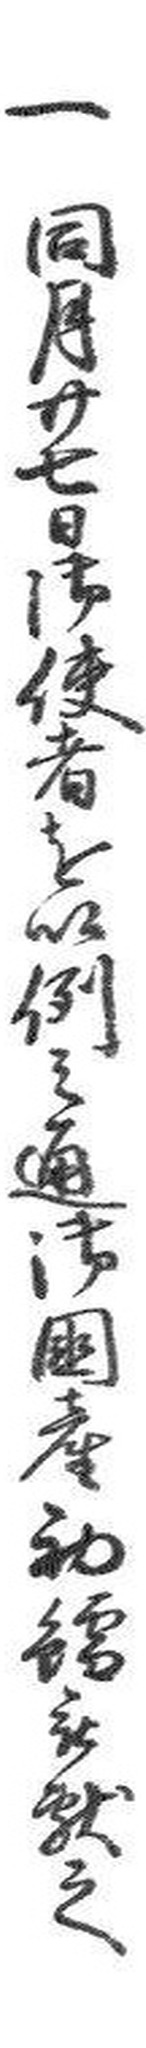一同月廿七日御使者を以例之通御国産初鱈被献之
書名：家譜 八 光通公 従寛文十年到同十二年
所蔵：福井県文書館 Fukui Prefectural Archives
